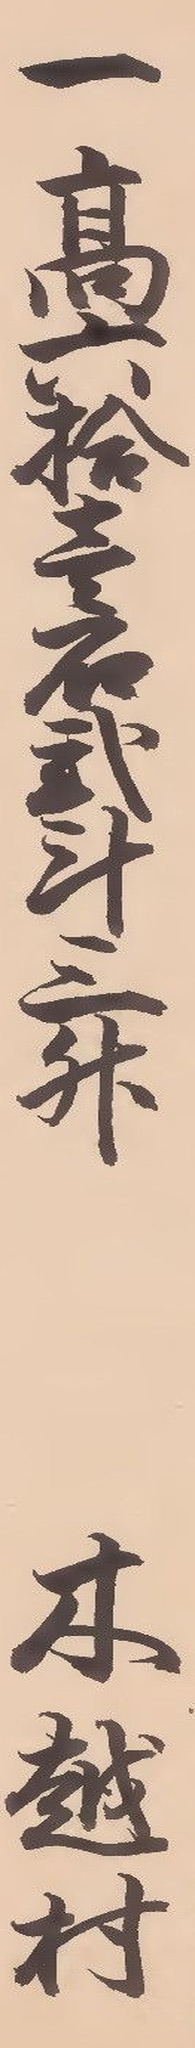一高六拾壱石弐斗三升木越村
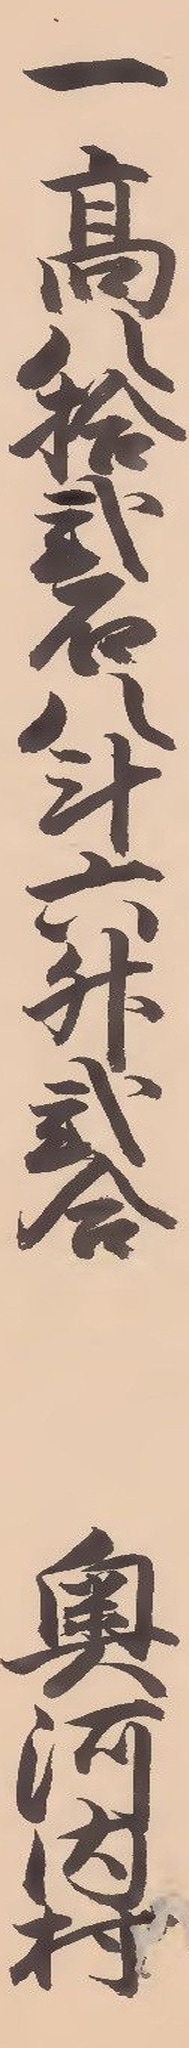一高八拾弐石八斗六升弐合奥河内村
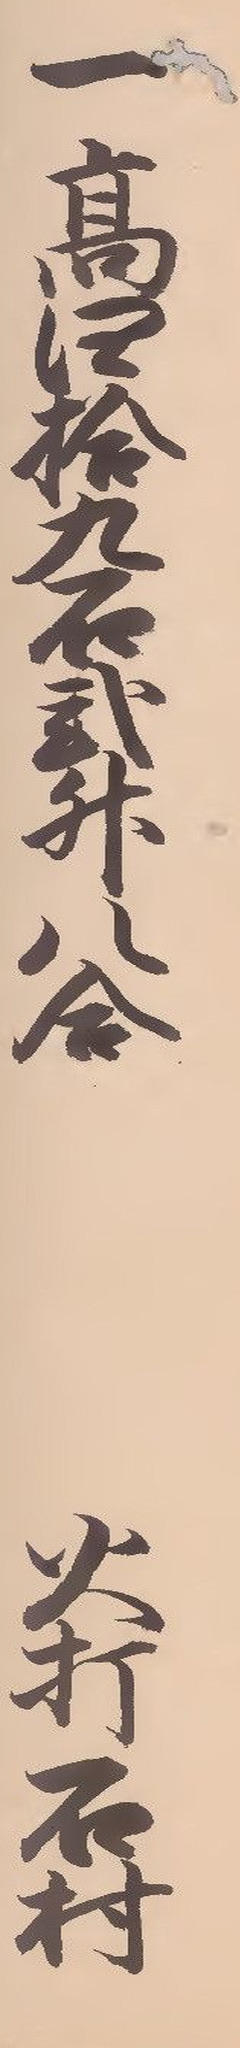一高四拾九石弐升八合火打石村
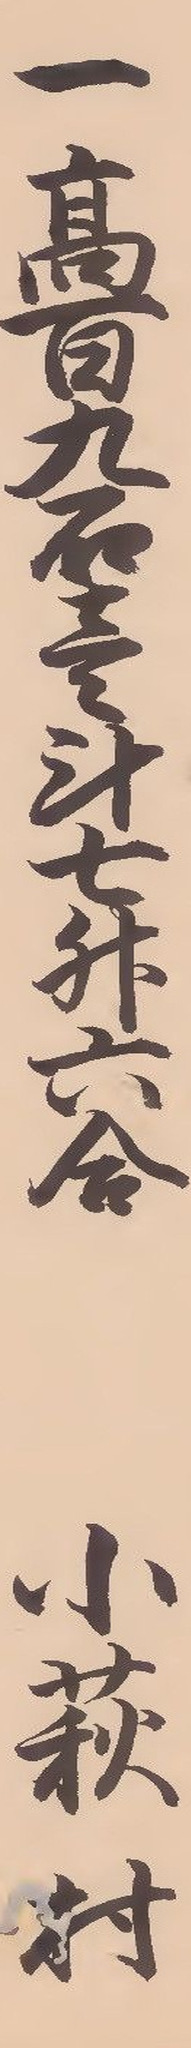一高百九石壱斗七升六合小萩村
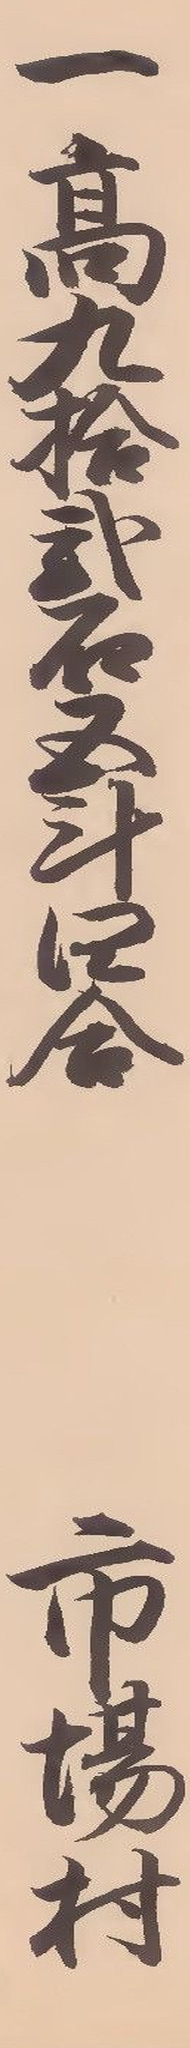一高九拾弐石五斗四合市場村

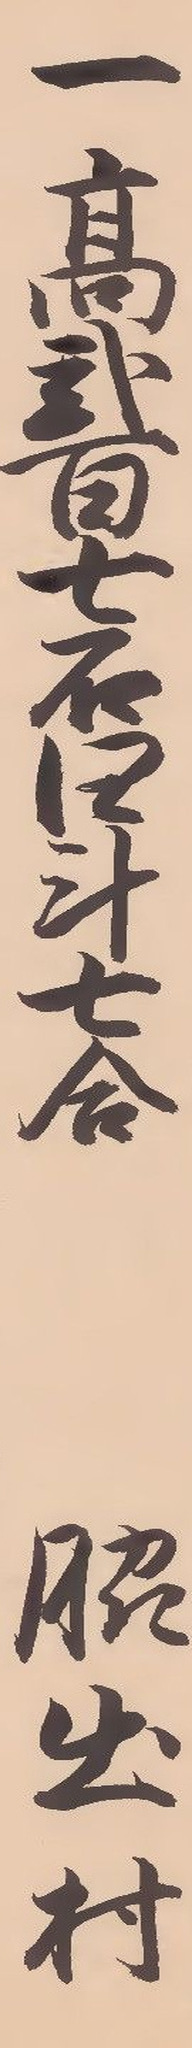一高弐百七石四斗七合脇出村
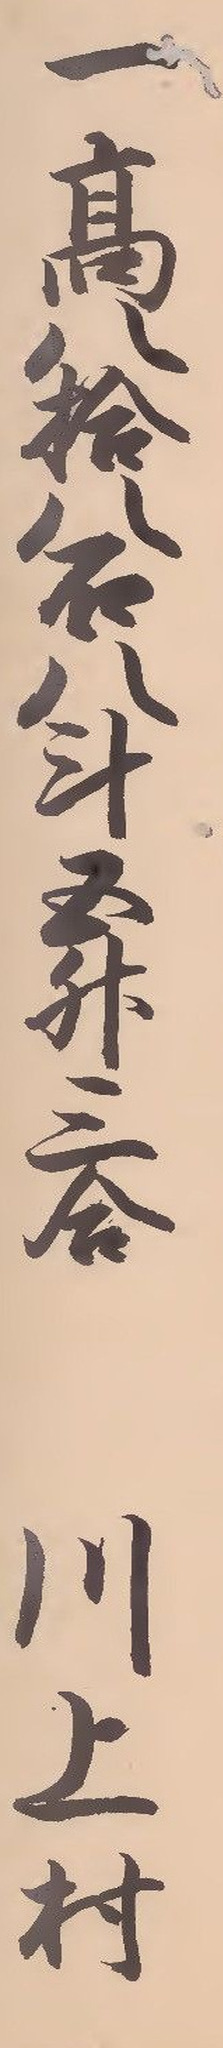一高八拾八石八斗五升三合川上村
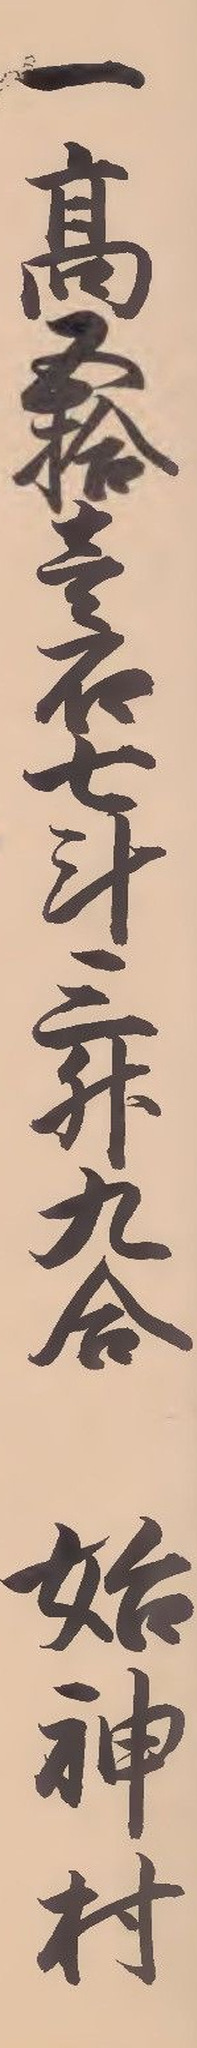一高五拾壱石七斗三升九合始神村
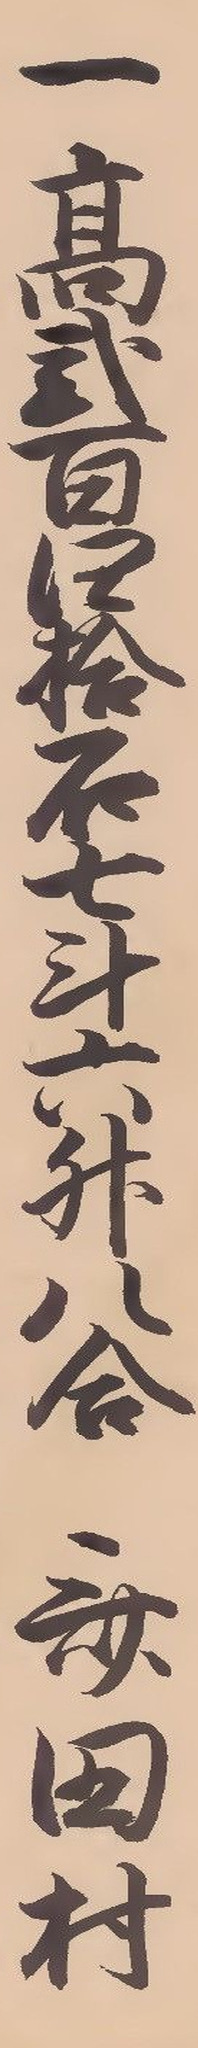一高弐百四拾石七斗六升八合斎田村

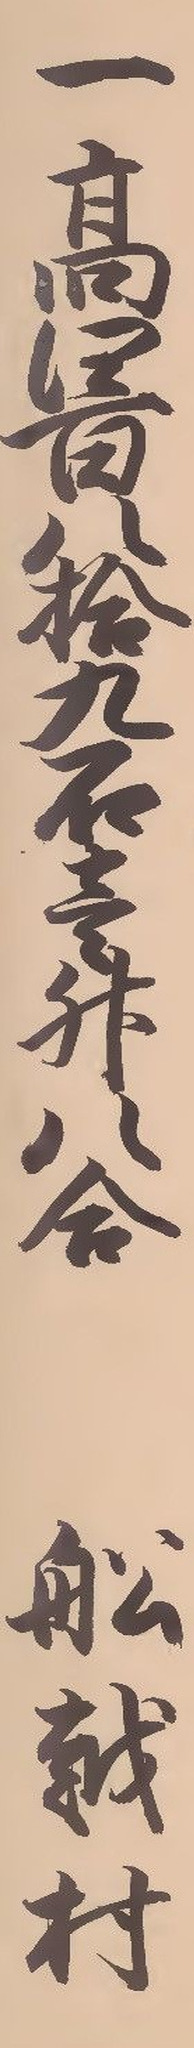一高四百八拾九石壱升八合船越村
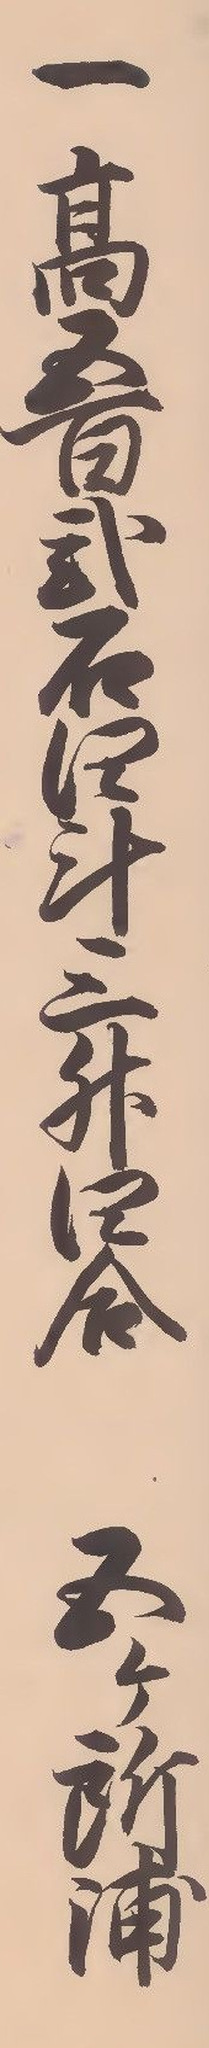一高五百弐石四斗三升四合五ケ所浦
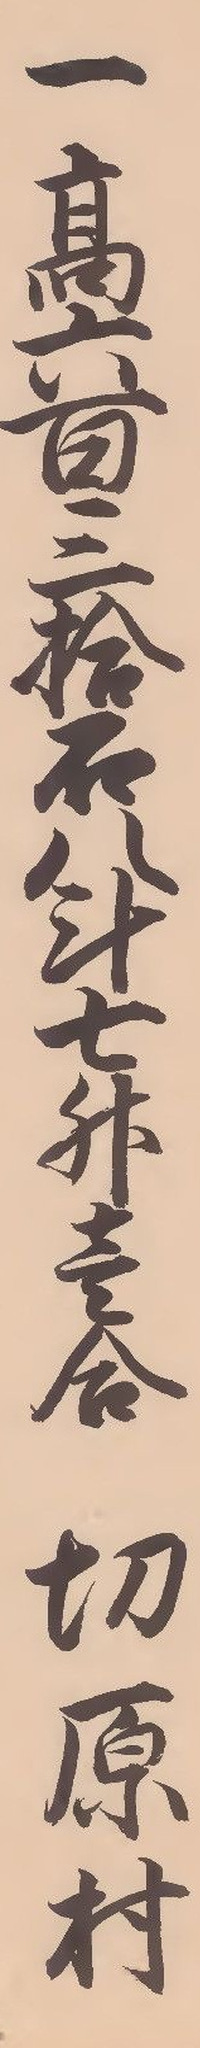一高六百三拾石八斗七升壱合切原村
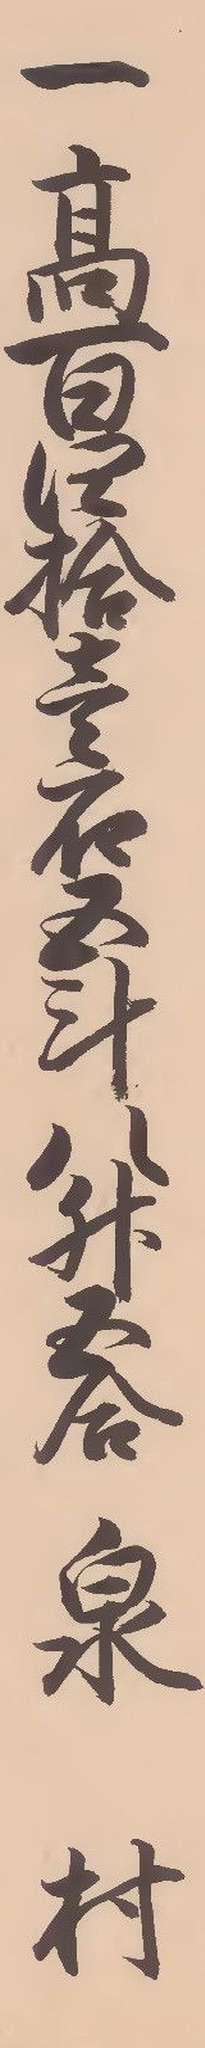一高百四拾壱石五斗八升五合泉村

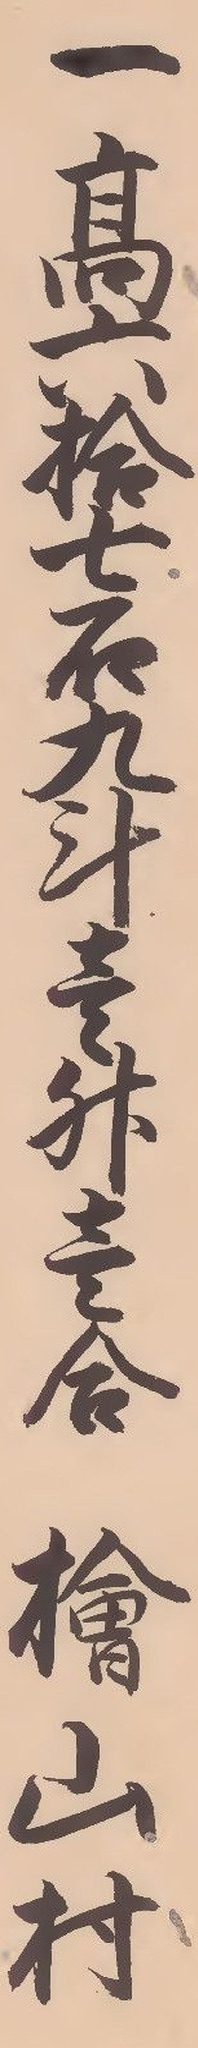一高六拾七石九斗壱升壱合桧山村
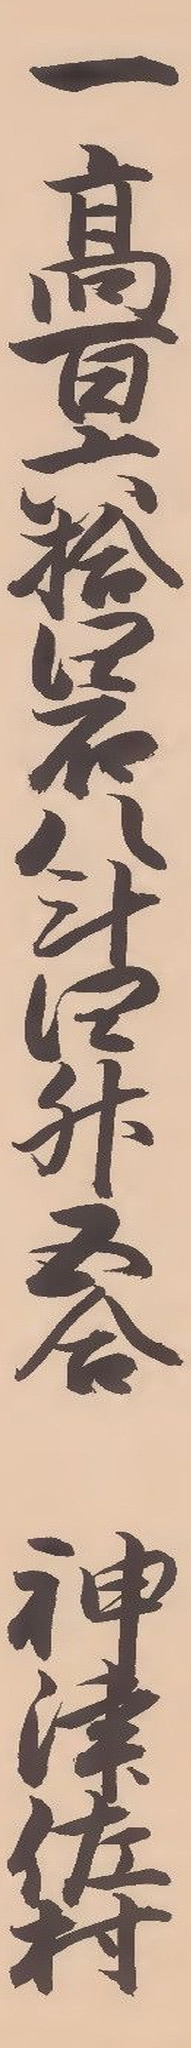一高百六拾四石八斗四升五合神津佐村
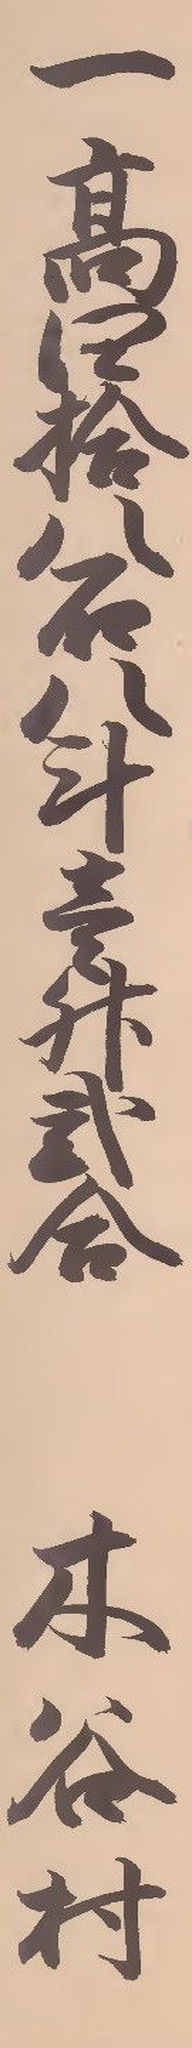一高四拾八石八斗壱升弐合木谷村
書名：伊勢国郷帳
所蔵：国立公文書館 National Archives of Japan
